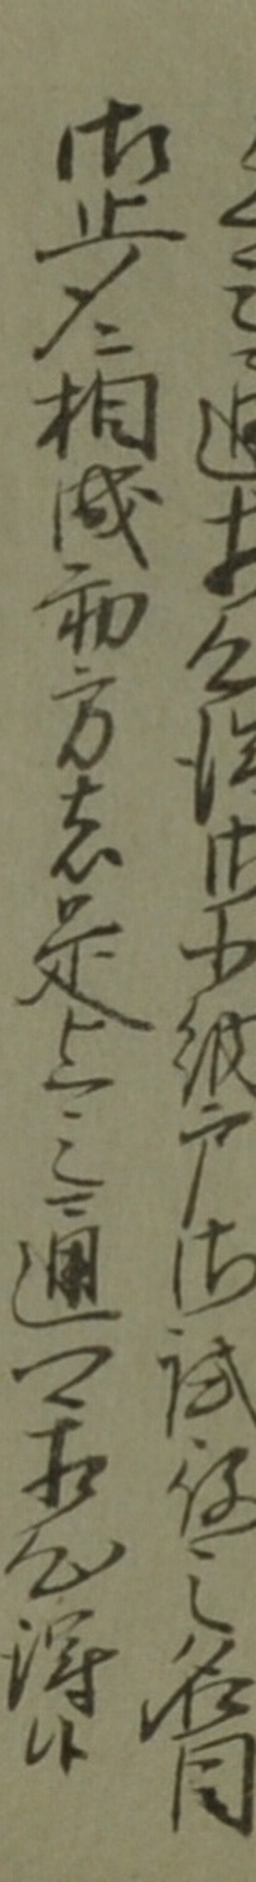御止メニ相成勤方者是迄之通可相心得候
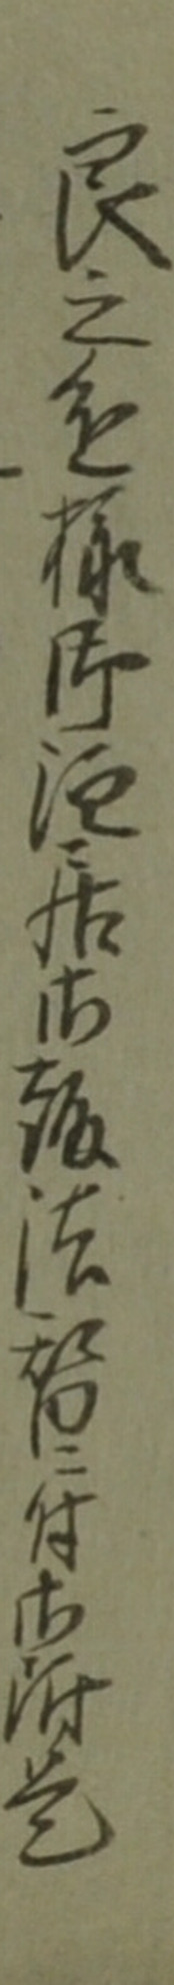良之進様御住居御趣法替ニ付御附是
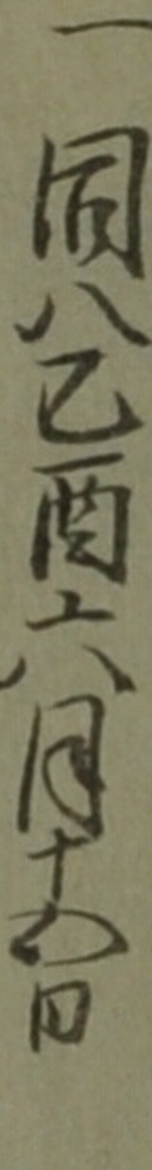一同八乙酉六月十五日
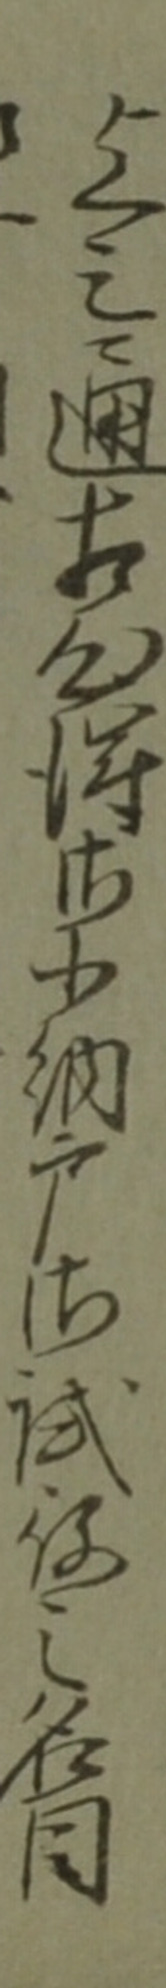迄之通相心得御小納戸悪御試役之名目
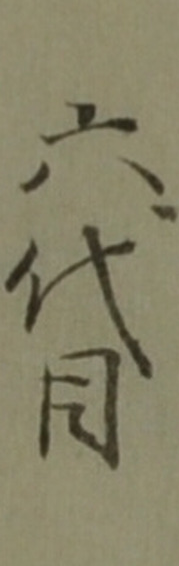六代目
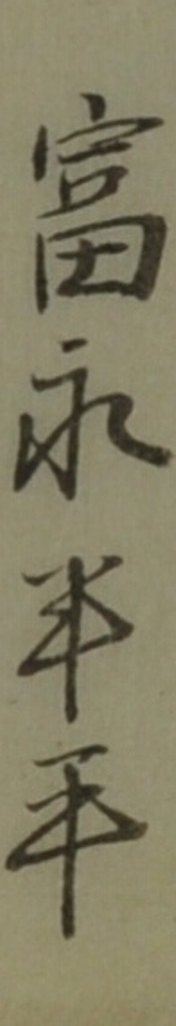富永半平
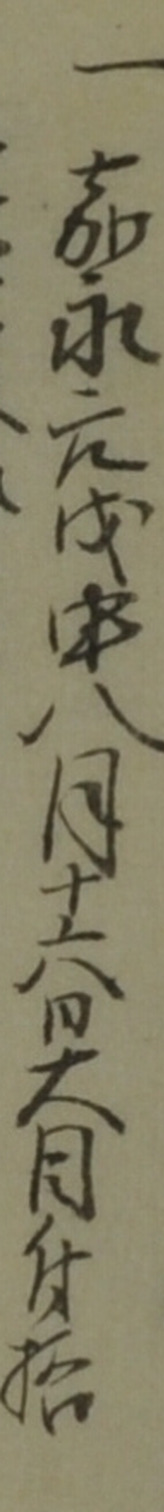一嘉永元戊申八月十六日大目付格
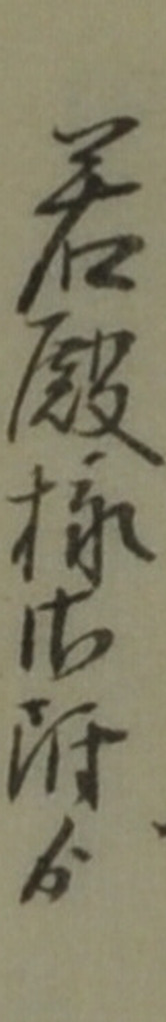若殿様御附ゟ
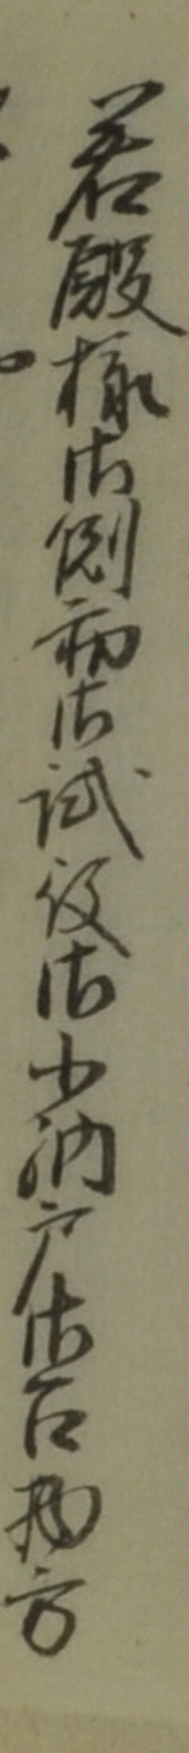若殿様御側勤御試役御小納戸御召物方
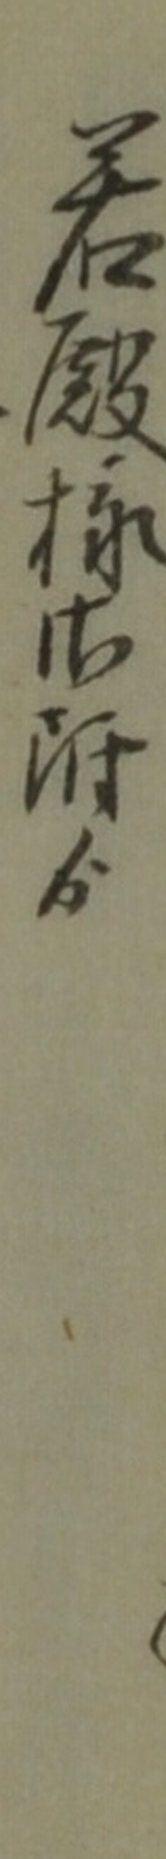若殿様御附ゟ

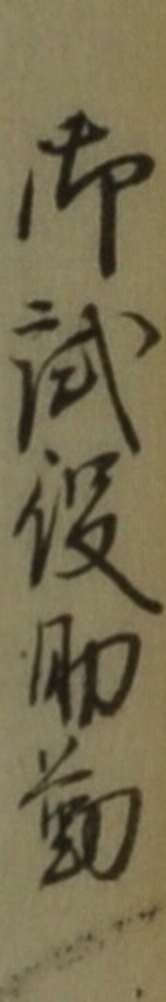御試役助勤
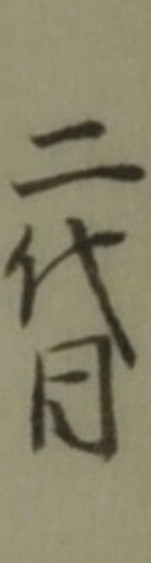二代目
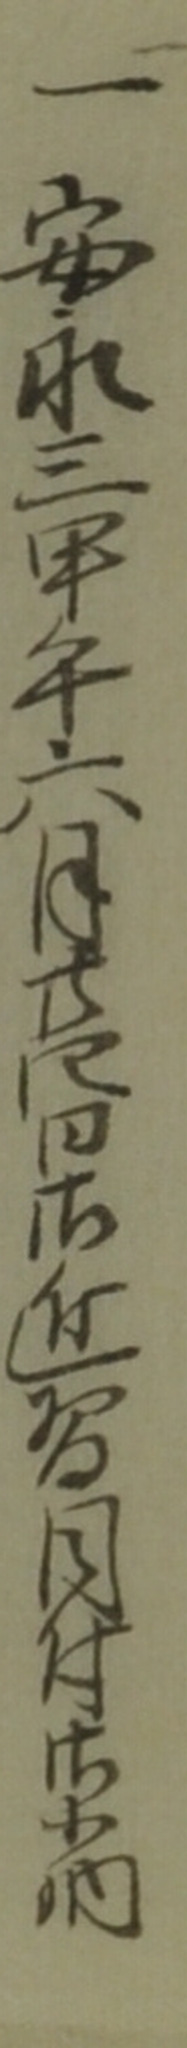一安永三甲午六月廿四日御近習目付御小納
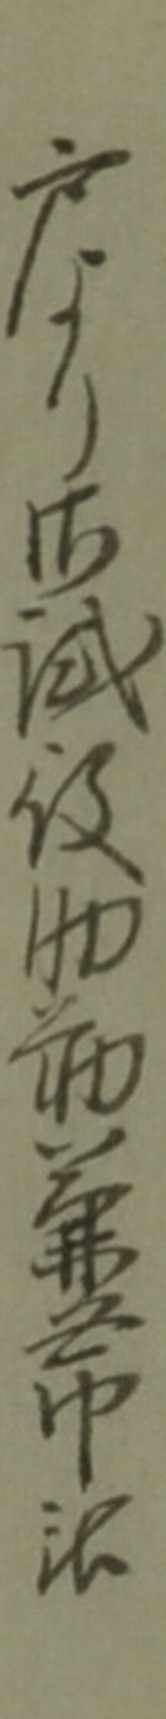戸より御試役助勤兼帯被
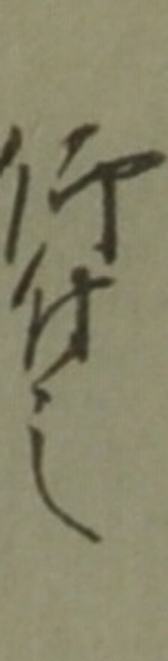仰付之
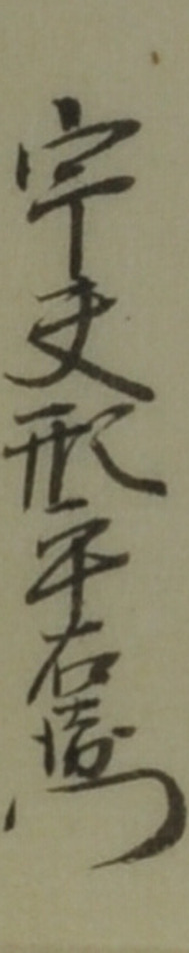宇夫形平右衛門
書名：諸御役代々録（四）
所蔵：伊那市立高遠町図書館・合同会社AMANE
